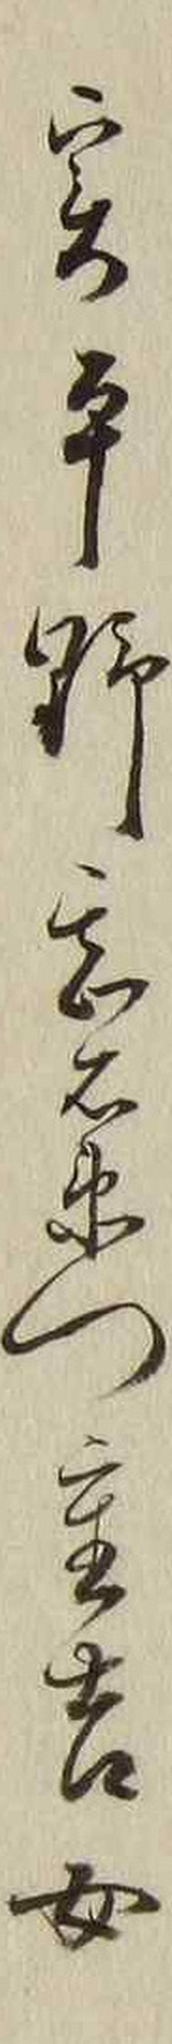実平野甚右衛門重吉女

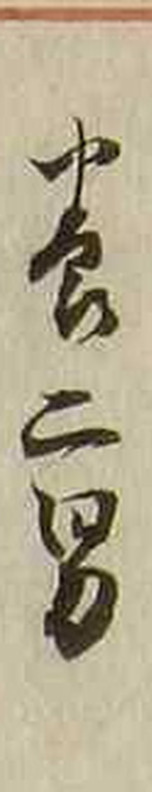養二男
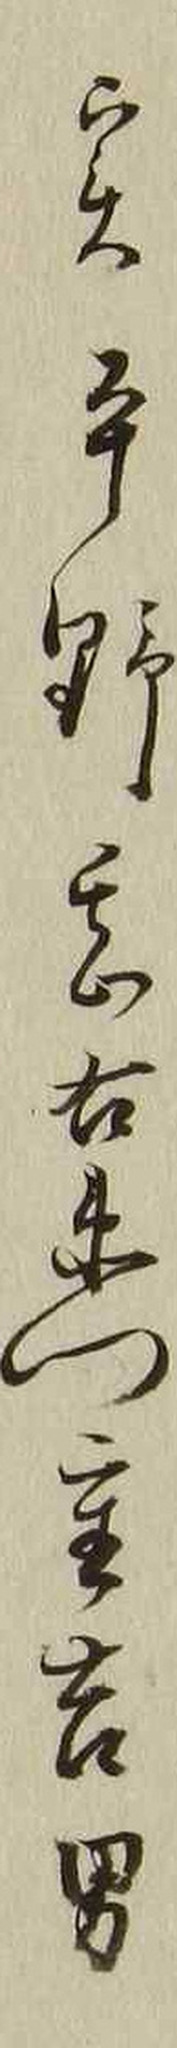実平野甚右衛門重吉男
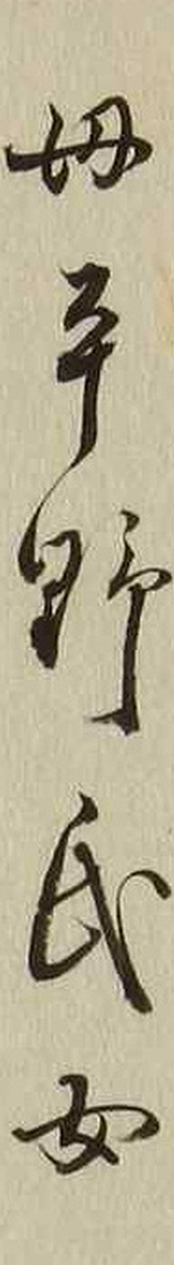母平野氏女
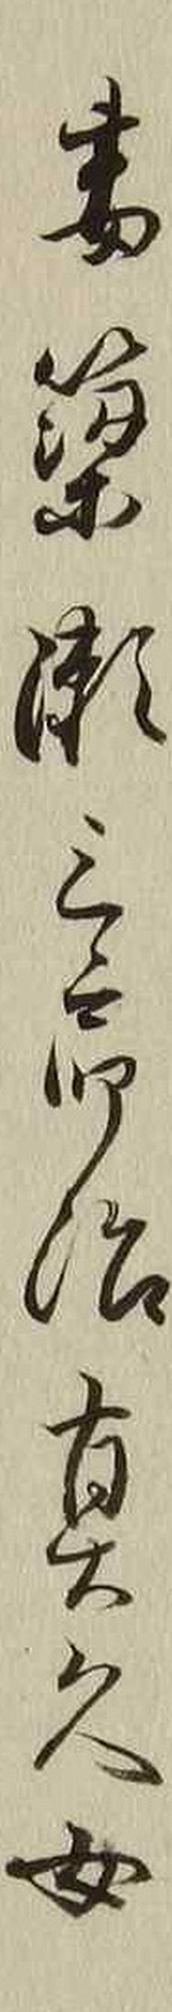妻簗瀬三郎治真久女
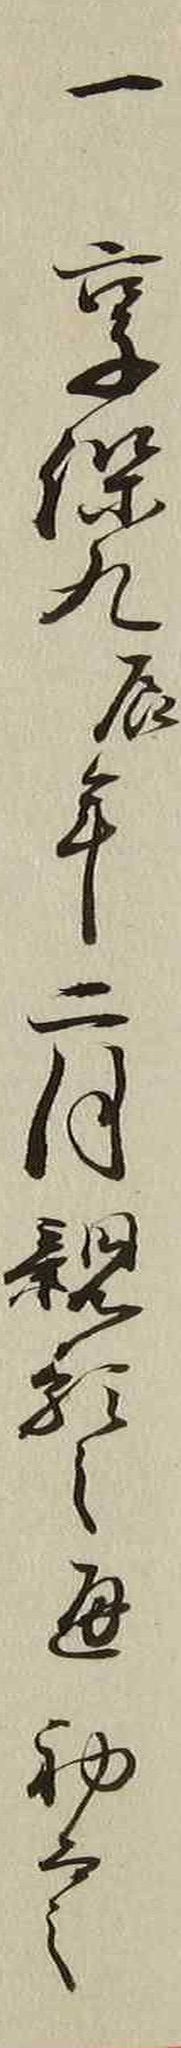一享保九辰年二月親願之通初而之
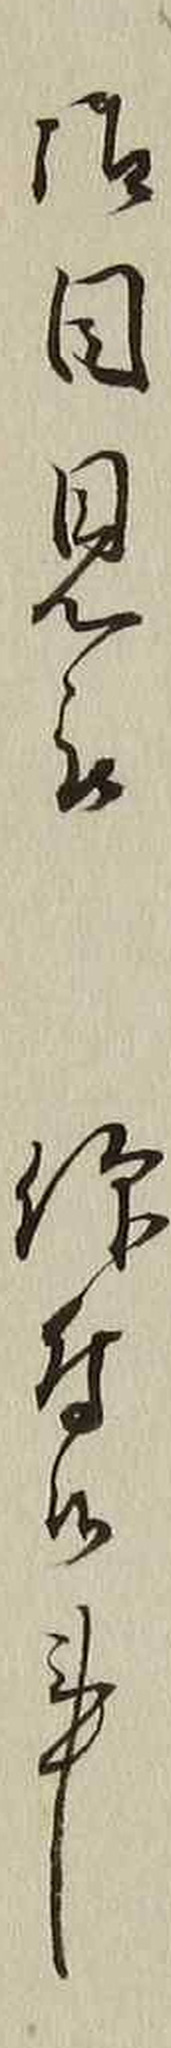御目見被仰付候事
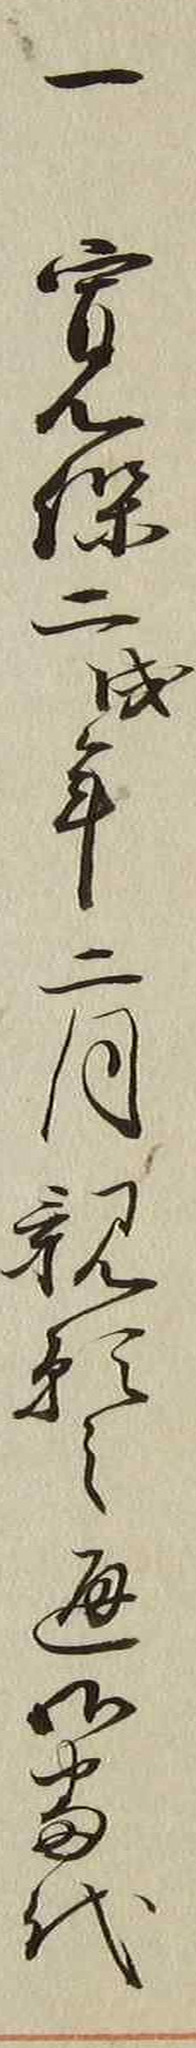一寛保二戌年二月親願之通御番代
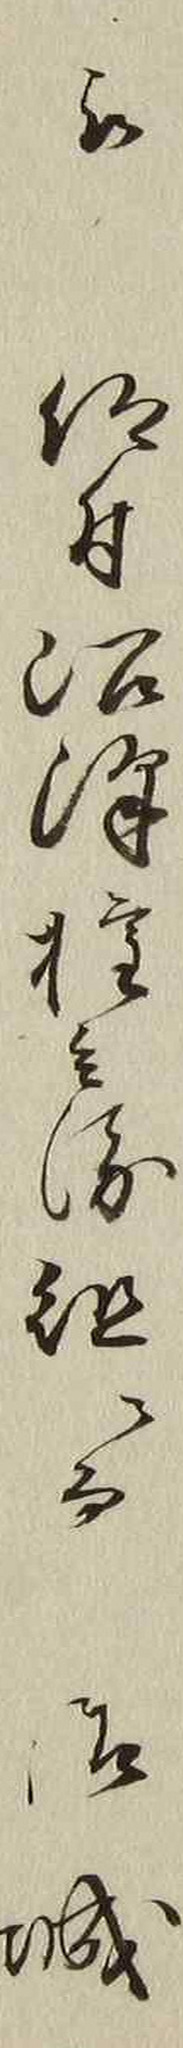被仰付沼沢権兵衛組ニ而御城
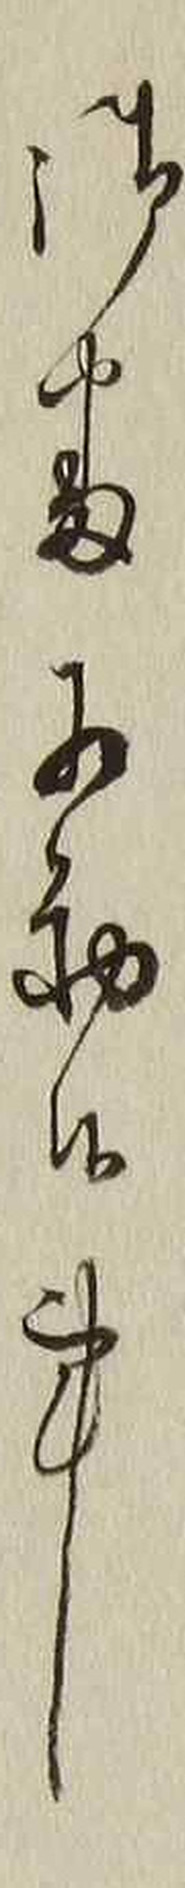御番相勤候事
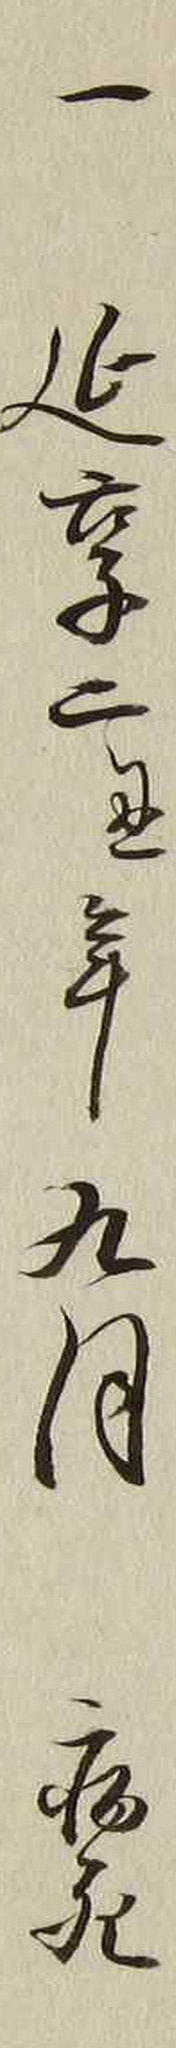一延享二丑年九月病死

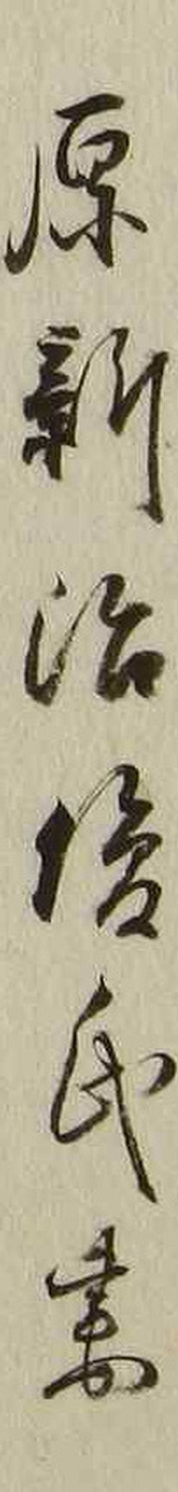原新治俊氏妻
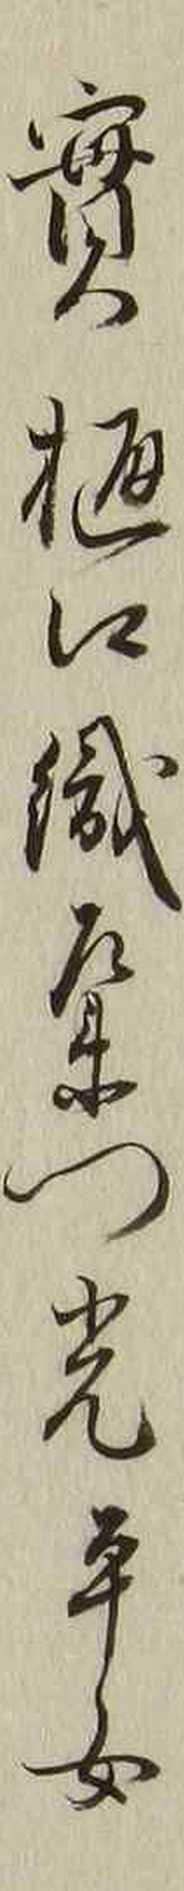実樋口織左衛門光平女
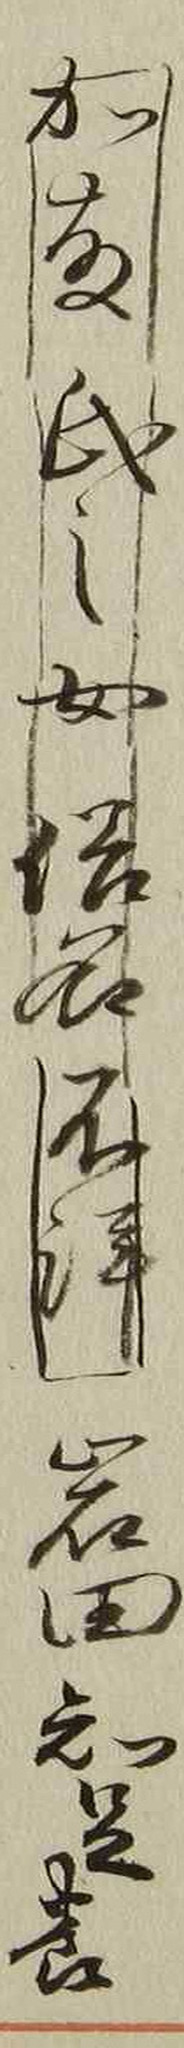「加藤氏之女俗名不詳」岩田知足養
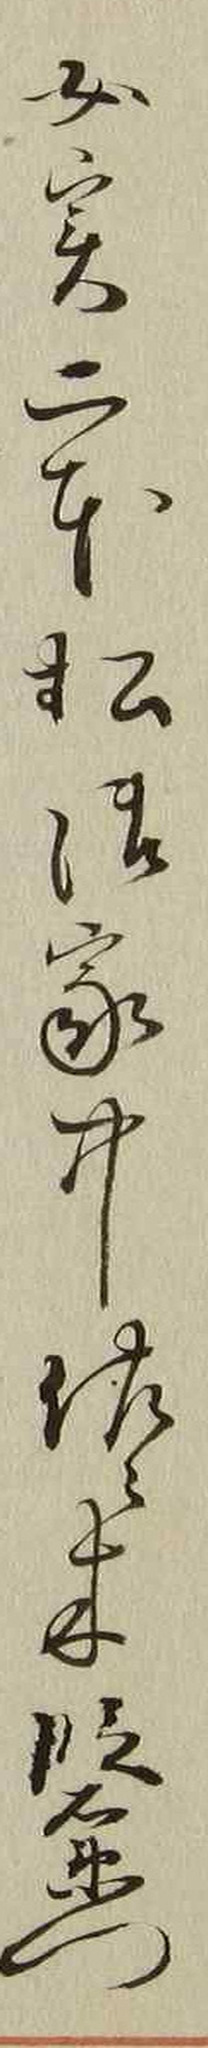女実二本松御家中佐々木段右衛門
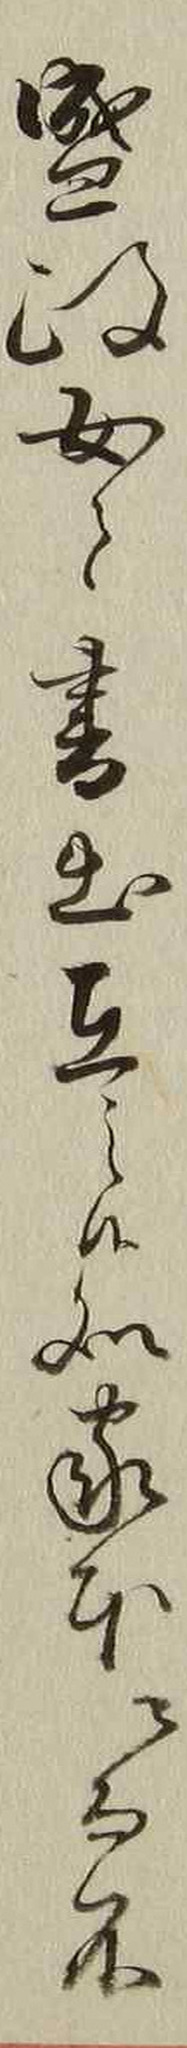盛政女と書出在之候処家本ニ而不
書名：諸士系譜　巻之26　い之部26
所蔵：会津若松市立会津図書館
